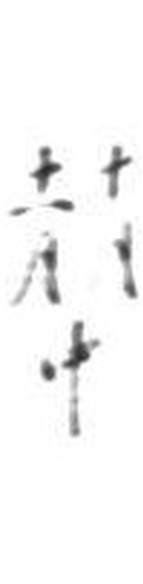十一月中
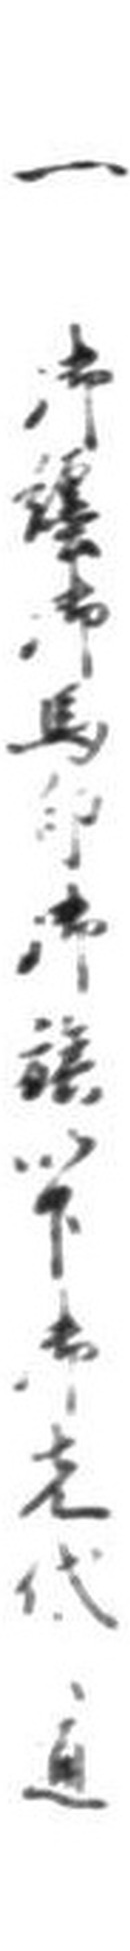一御纏御馬印御旗以下御先代之通
